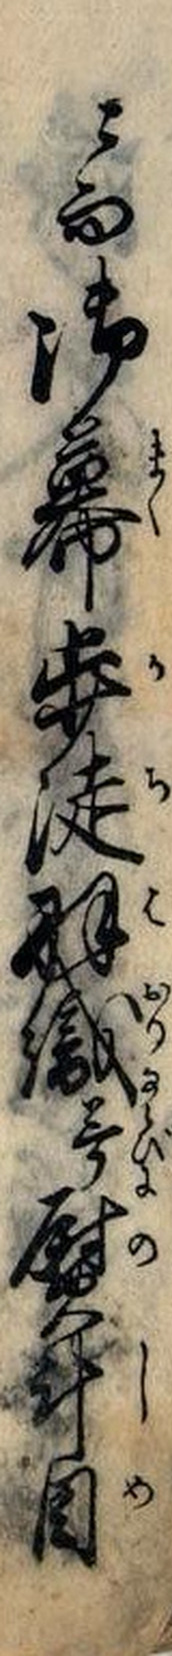に而御幕歩徒羽織并熨斗目
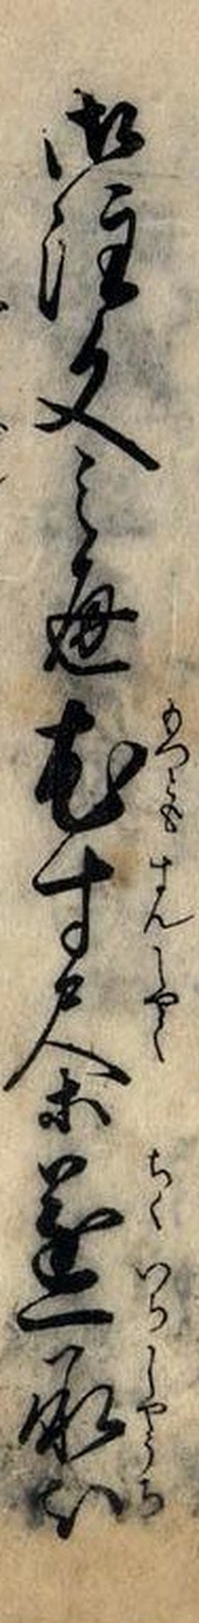御注文之通尤寸尺等逐一承知
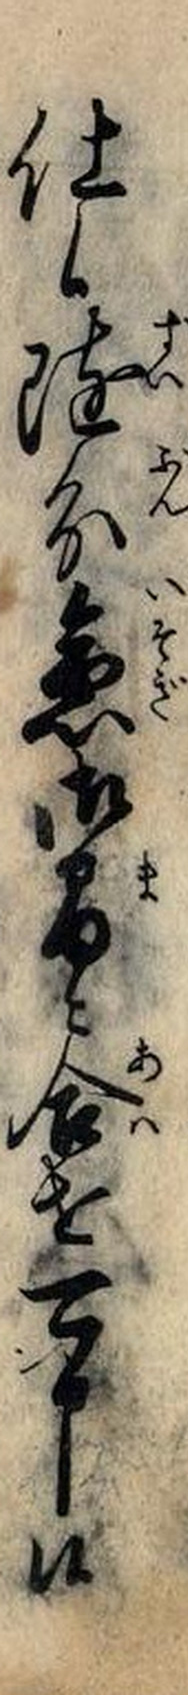仕候随分急御間に合せ可申候
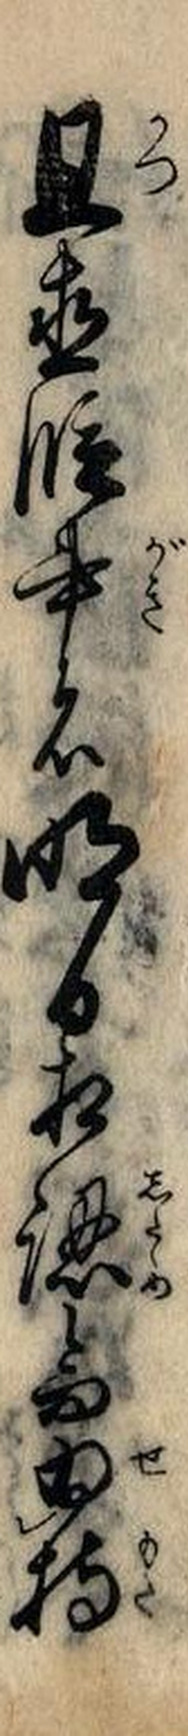且直段書者明日相認候而為持
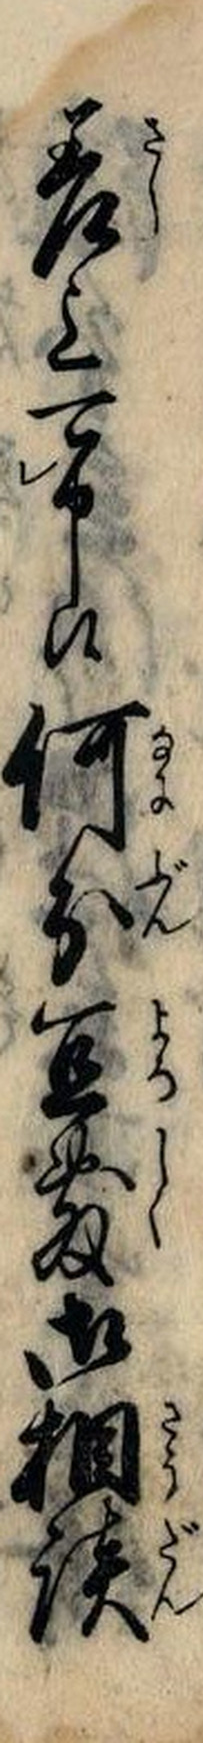差上可申候何分宜敷御相談
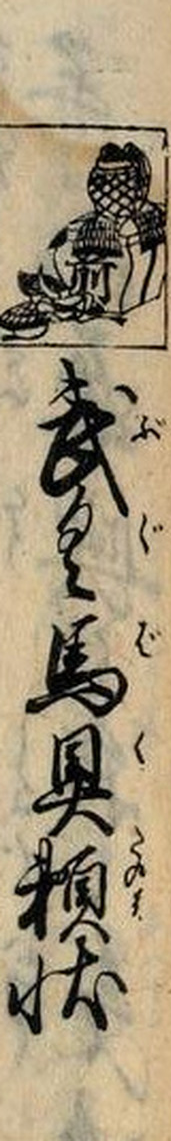武具馬具頼状
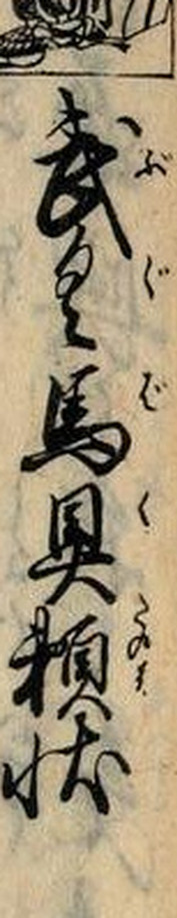武具馬具頼状
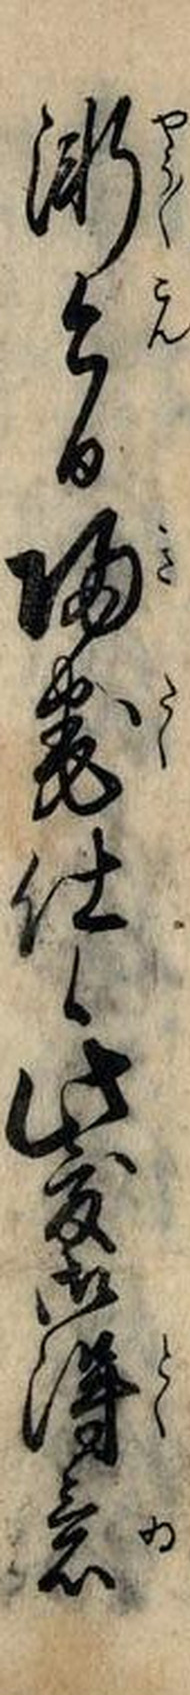漸今日帰宅仕候此度御得意
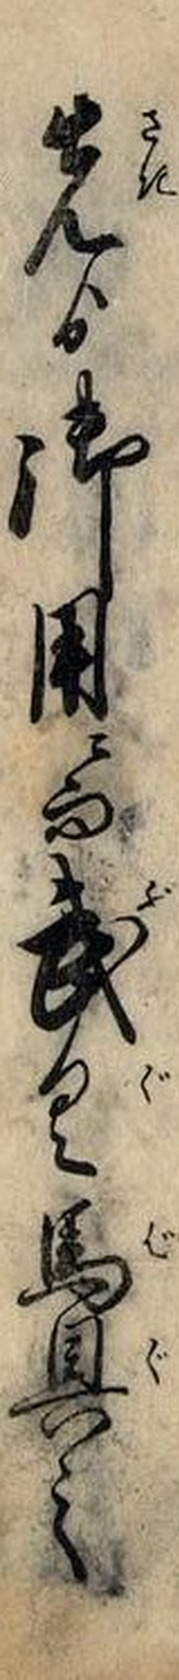先ゟ御用に而武具馬具之
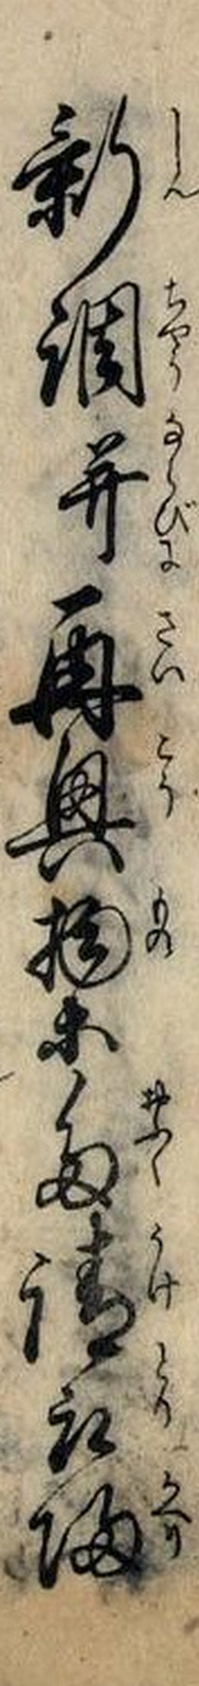新調并再興物等多請取帰
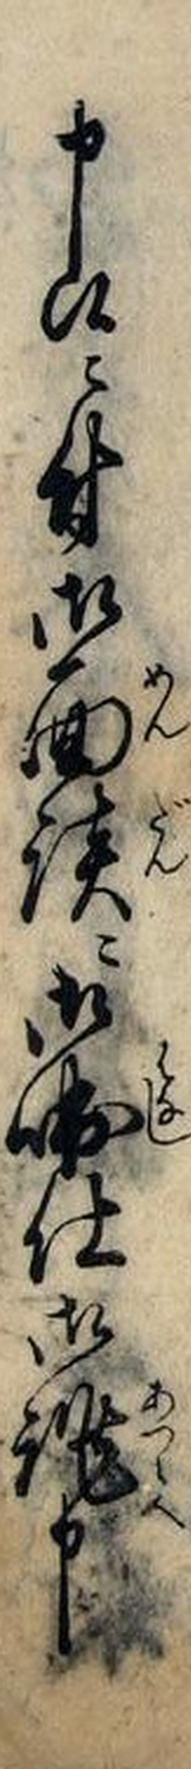申候に付御面談に御咄仕御誂申

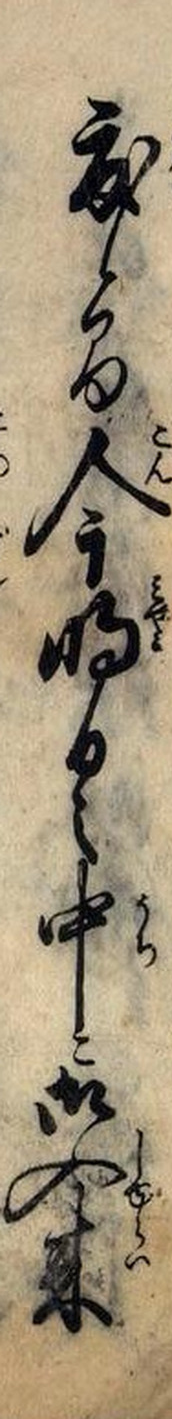度候間今明日之中に御入来
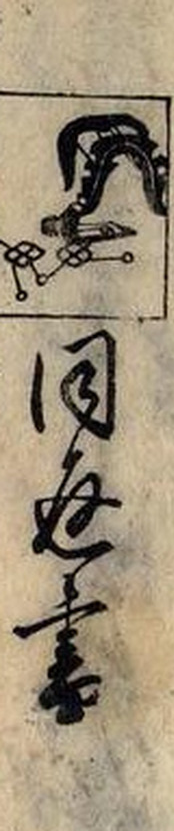同返書
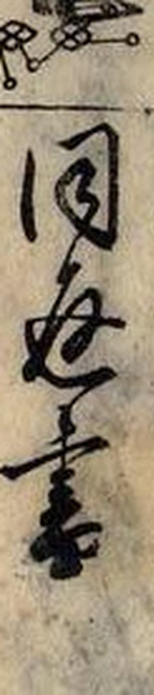同返書
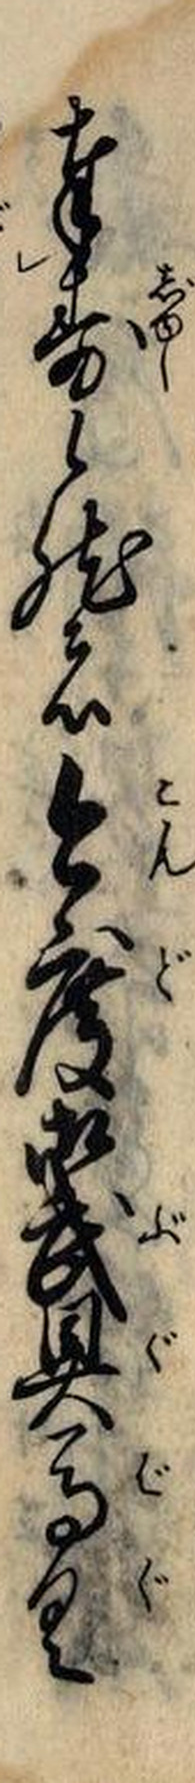奉寿候然者今度御武具馬具
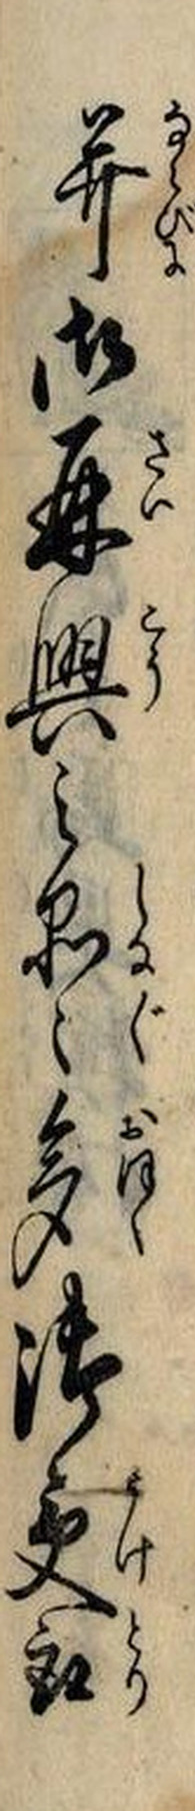并御再興之品々多御受取
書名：大成用文章（往来物）
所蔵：福井県文書館 Fukui Prefectural Archives
